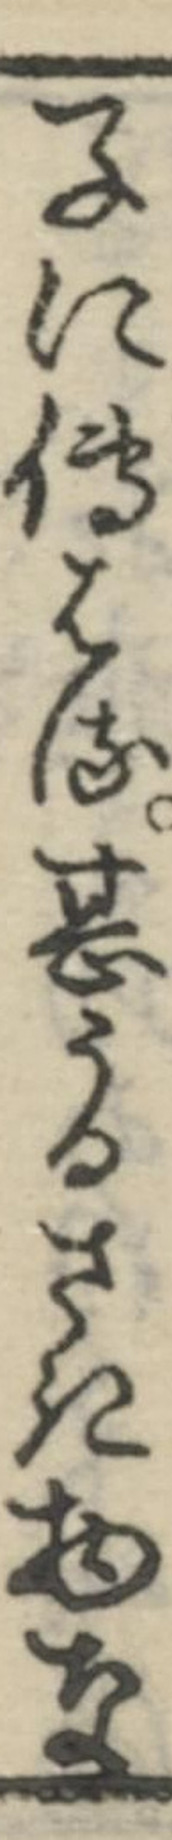子に伝はる。甚うるさき物な
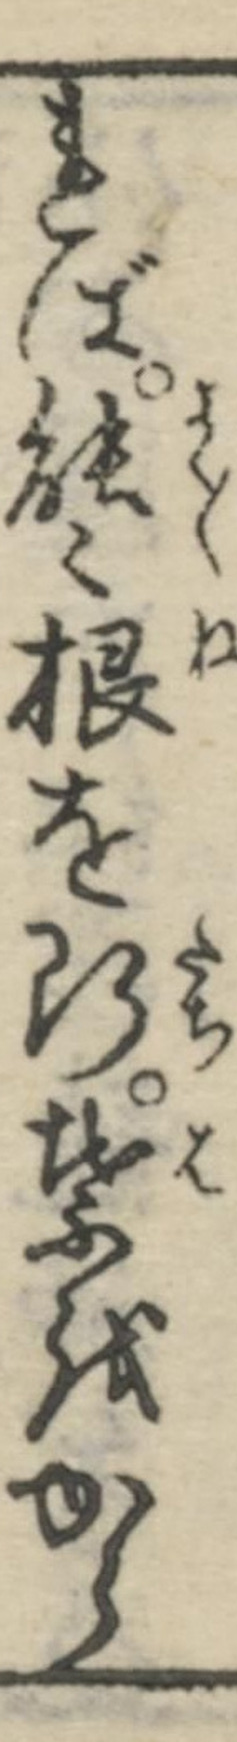れば。能々根を断。葉をから
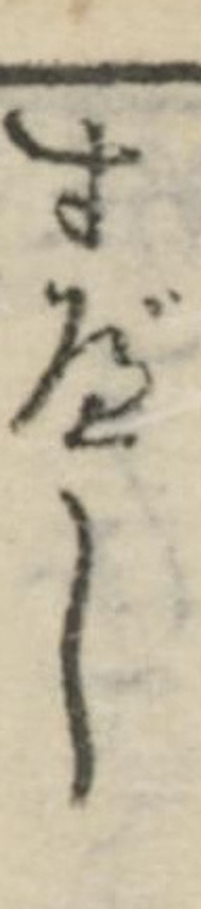すべし
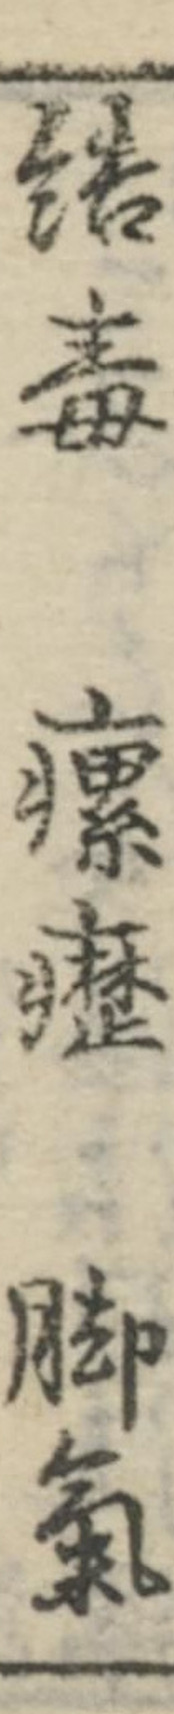結毒瘰癧脚気
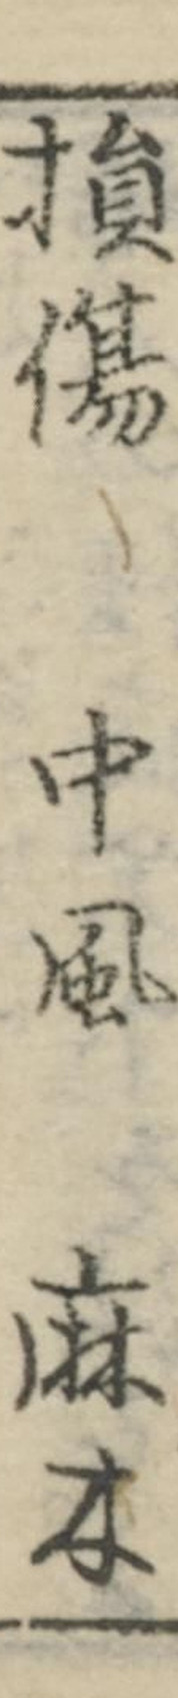損傷中風麻木
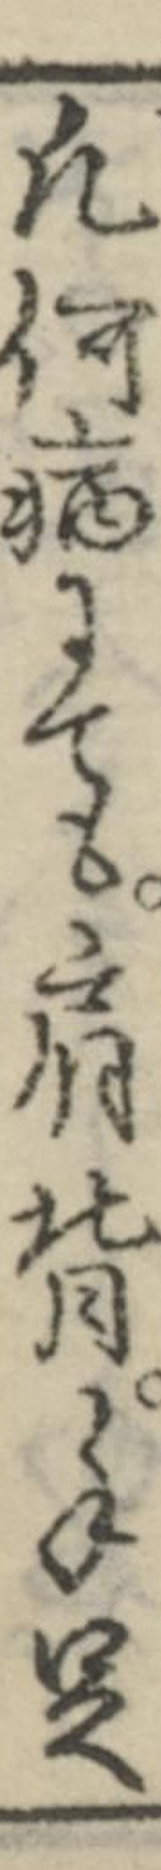凢何病にても。肩背。手足
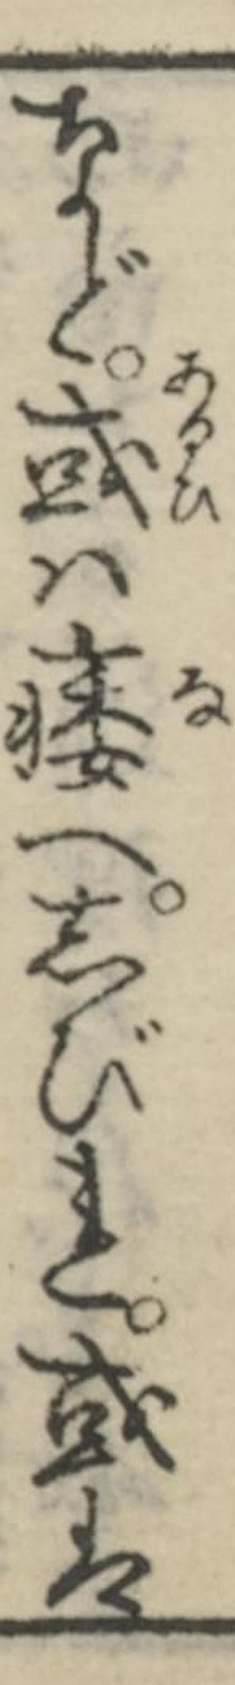など。或は痿へ。しびれ。或は
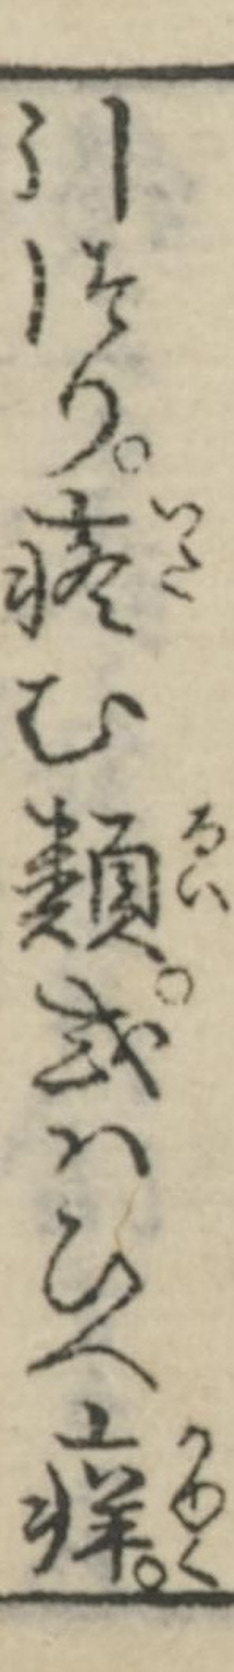引つり。疼む類。或はひへ痒。
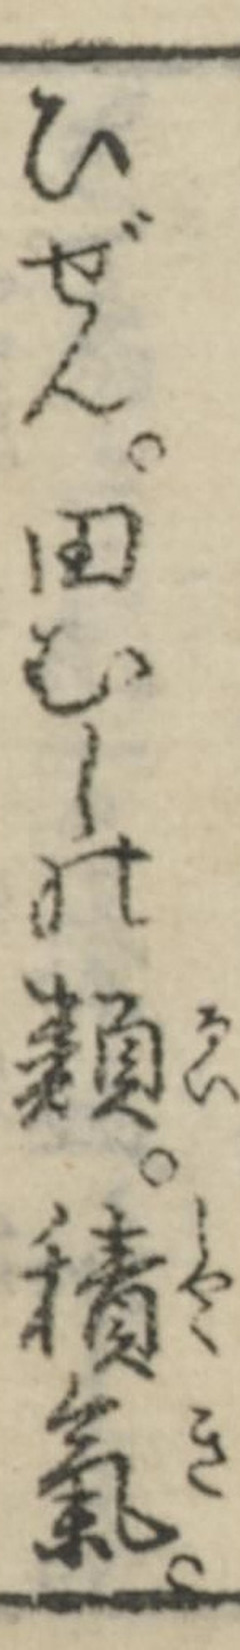ひぜん。田むしの類。積気。
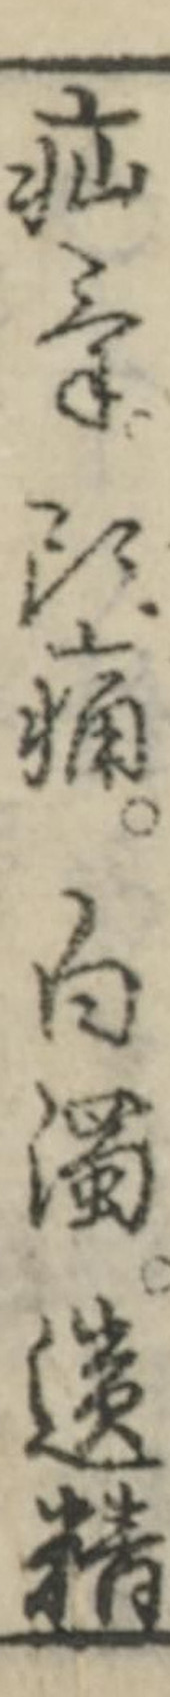疝気。頭痛。白濁。遺精。
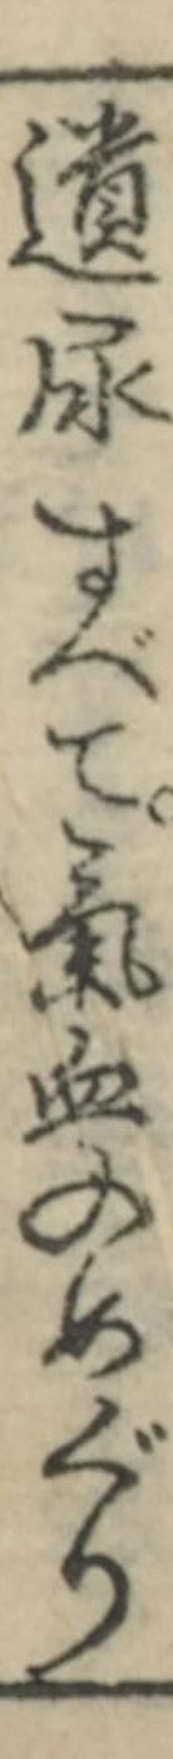遺尿。すべて気血のめぐり

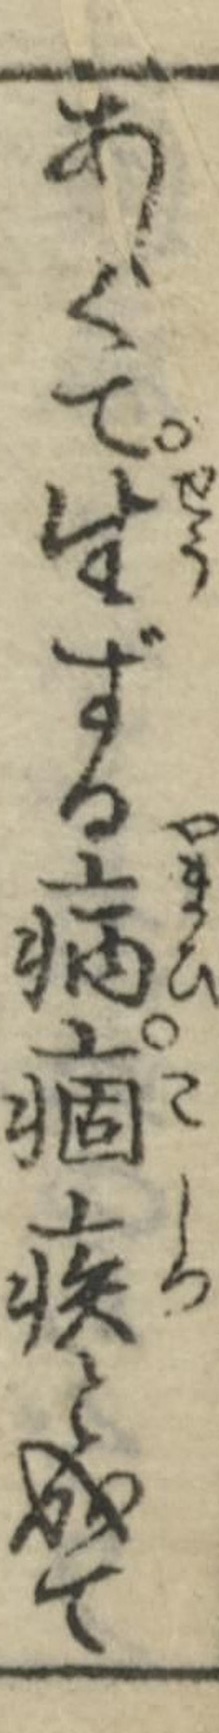あしくて。生ずる病。痼疾と成て
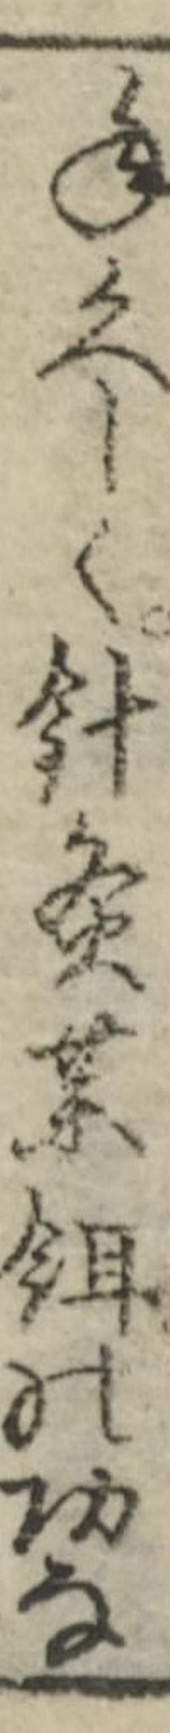年久しく。針灸薬餌の功な
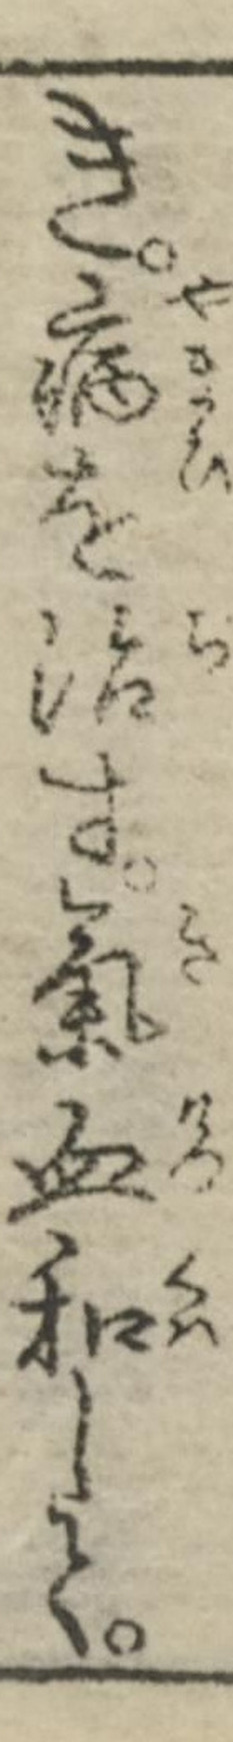き。病を治す。気血和して。
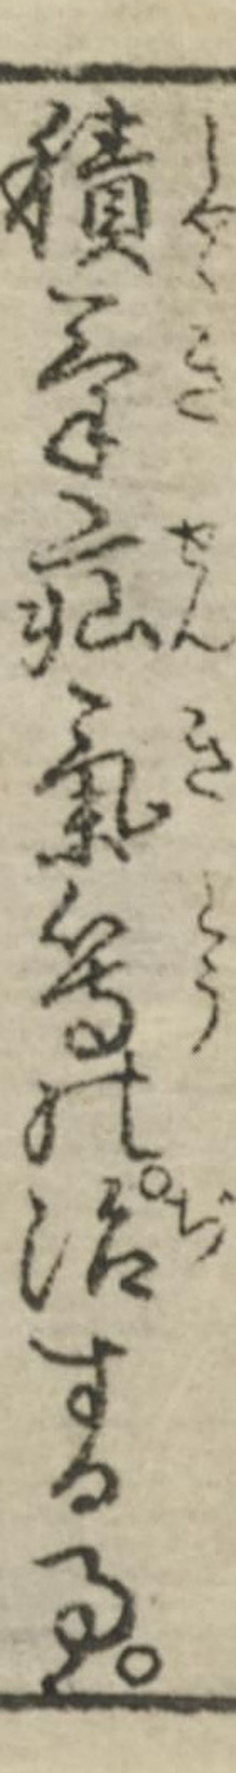積気疝気等の。治する事。
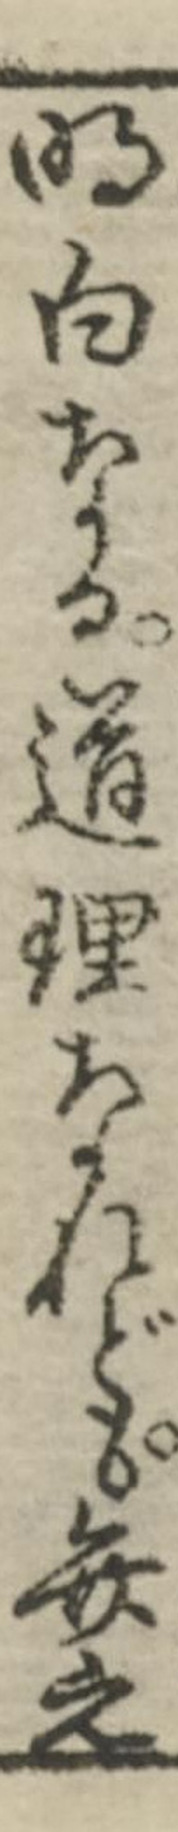明白なる。道理なれども。弁え
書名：但州城崎浴湯辧
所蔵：東京大学地震研究所図書室 Earthquake Research Institute Library, The University of Tokyo, JAPAN
